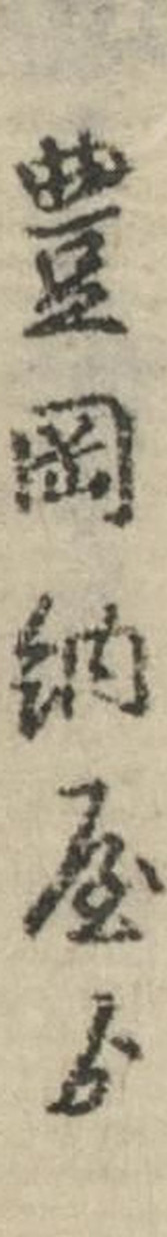豊岡納屋ゟ
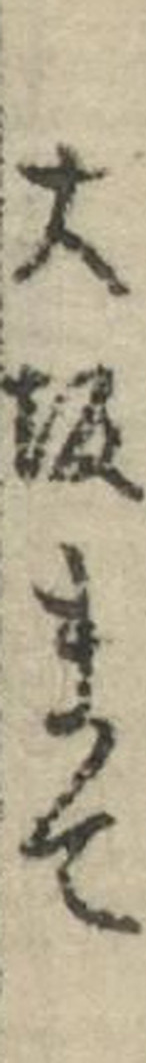大坂まて

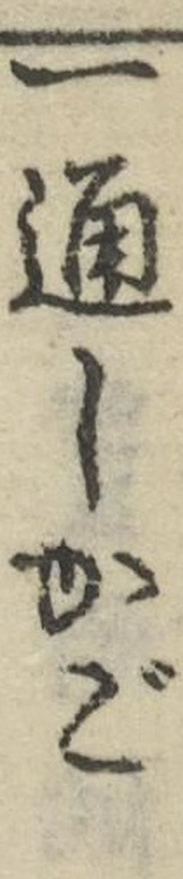一通しかご
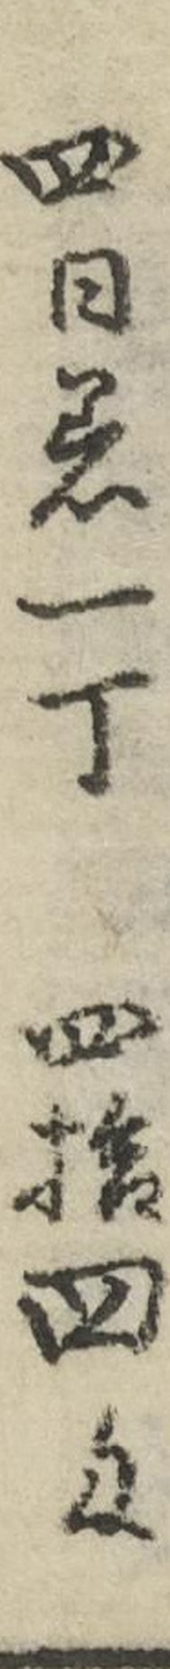四日着一丁四拾四匁
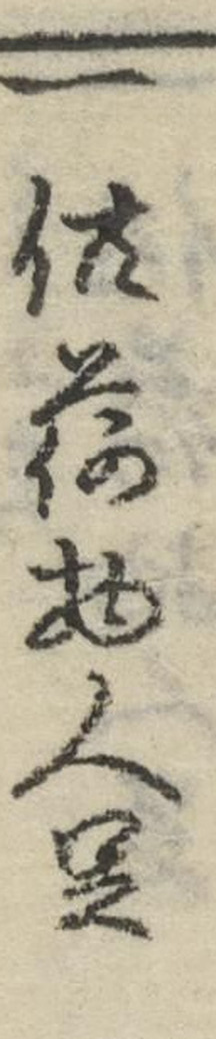一供荷物人足
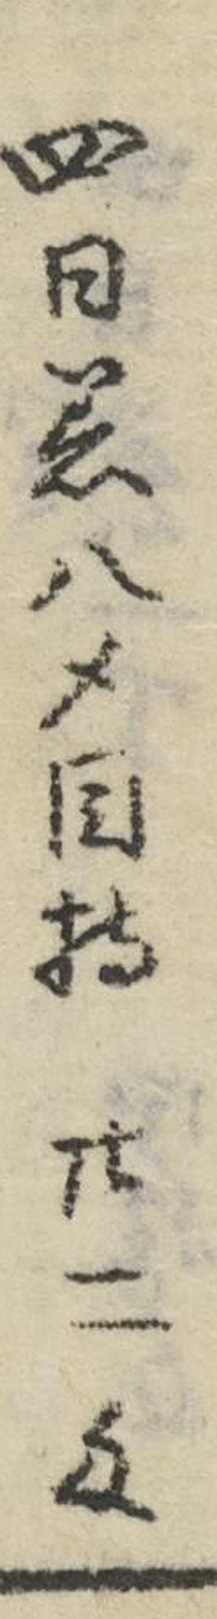四日着八貫目持廿二匁
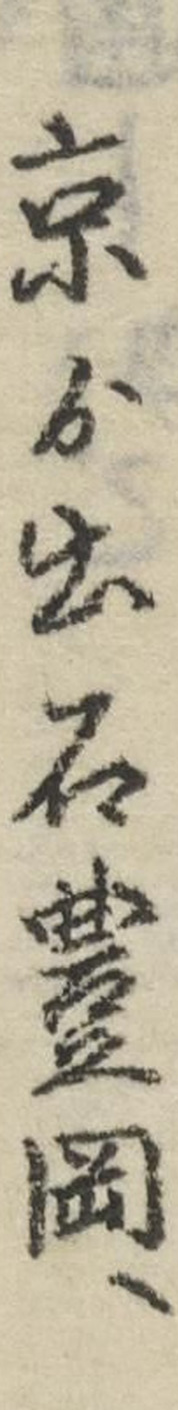京ゟ出石豊岡へ
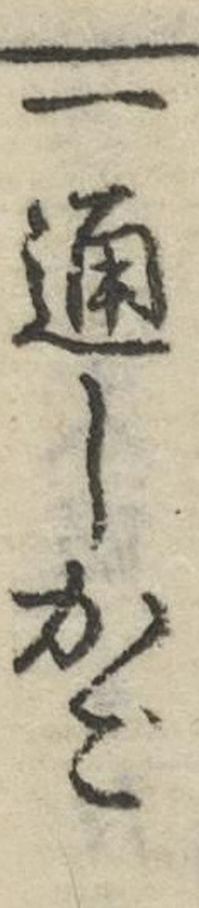一通しかご
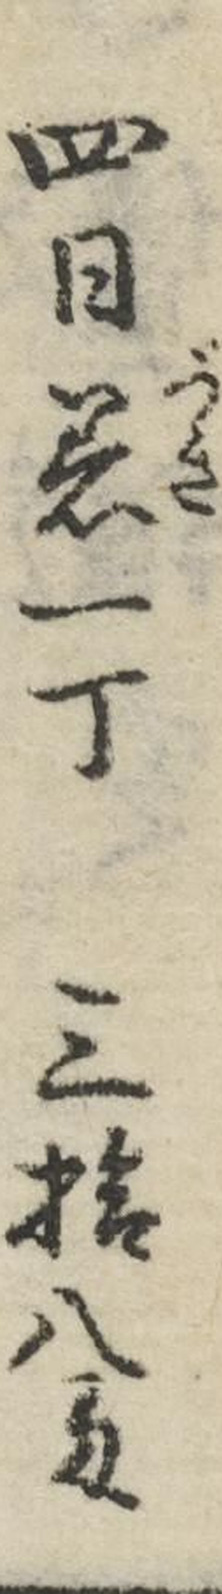四日着一丁三拾八匁
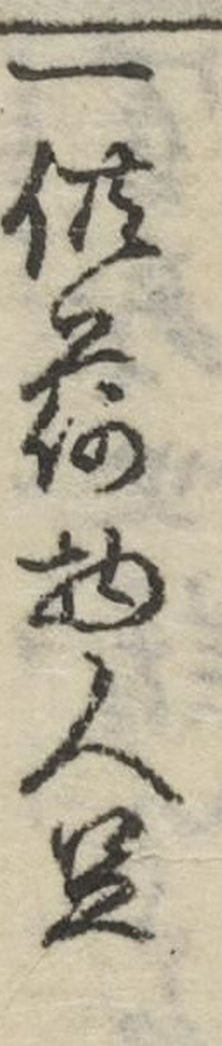一供荷物人足
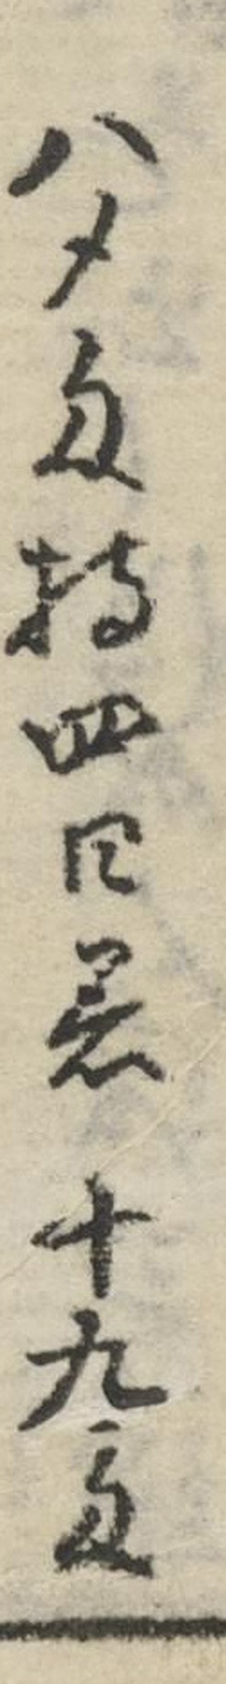八貫匁持四日着十九匁
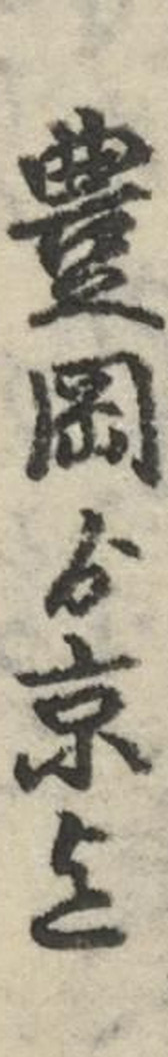豊岡ゟ京迄
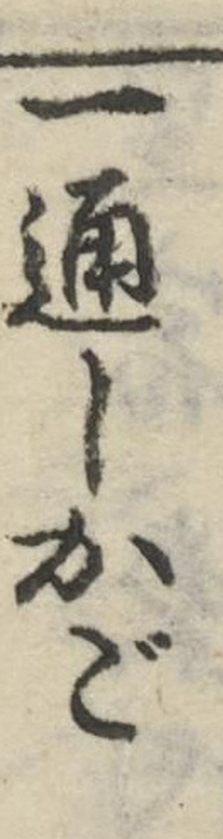一通しかご
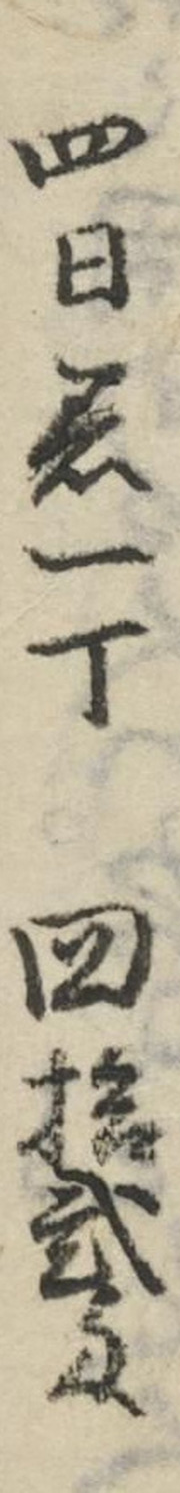四日着一丁四拾弐匁
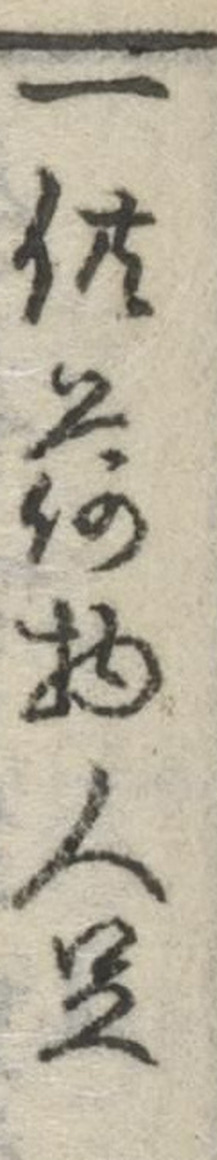一供荷物人足
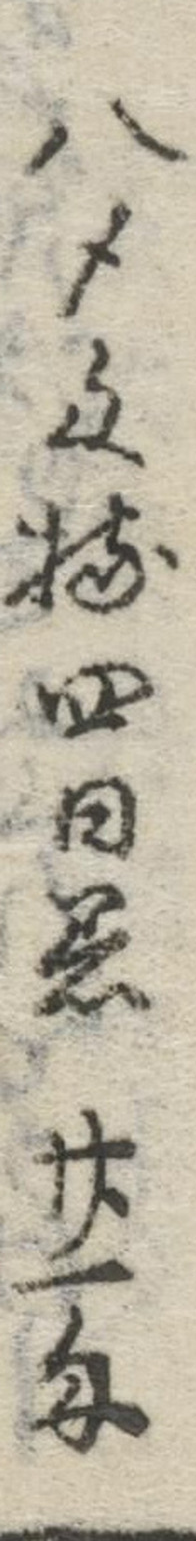八貫匁持四日着廿一匁
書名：但州城崎浴湯辧
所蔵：東京大学地震研究所図書室 Earthquake Research Institute Library, The University of Tokyo, JAPAN
